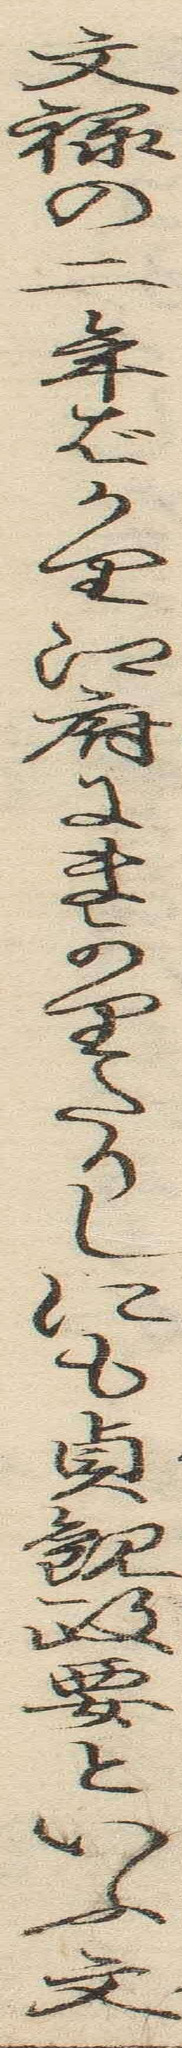文禄の二年ばかり江府にまかりたりしにも貞観政要といふ文
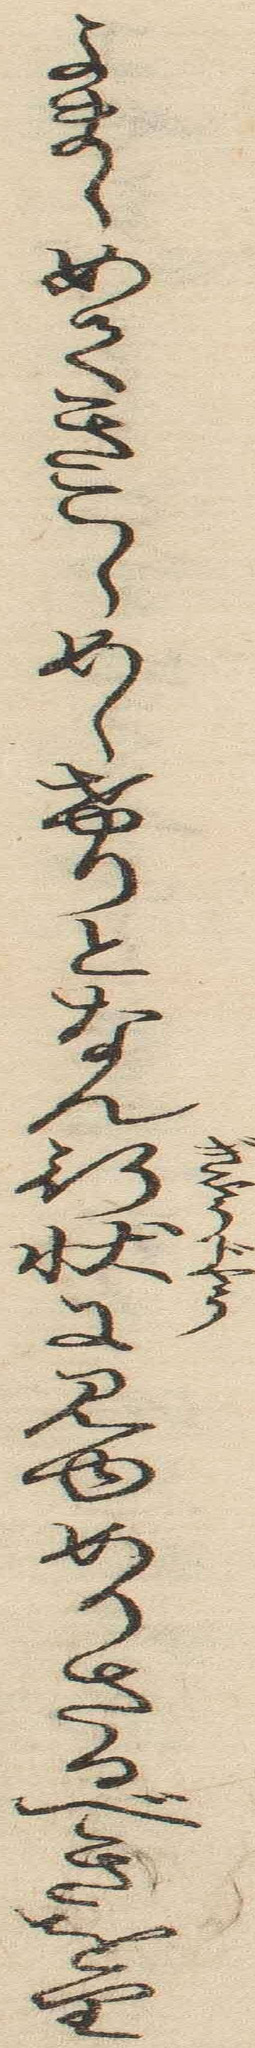よましめてきこしめしけりとなん行状に見ゆめりさるべきをり

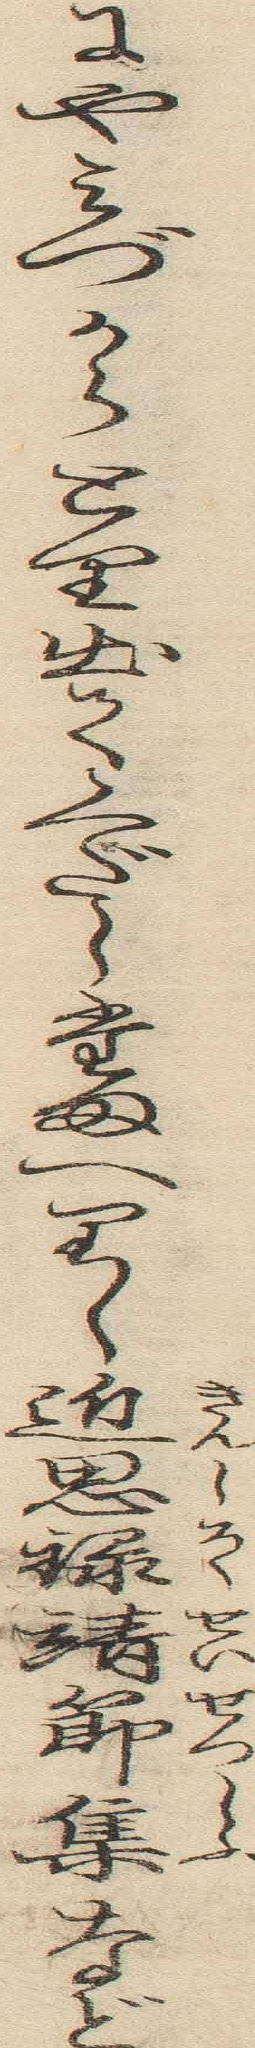にやみづからとり出てくだしたまへりし近思録靖節集など
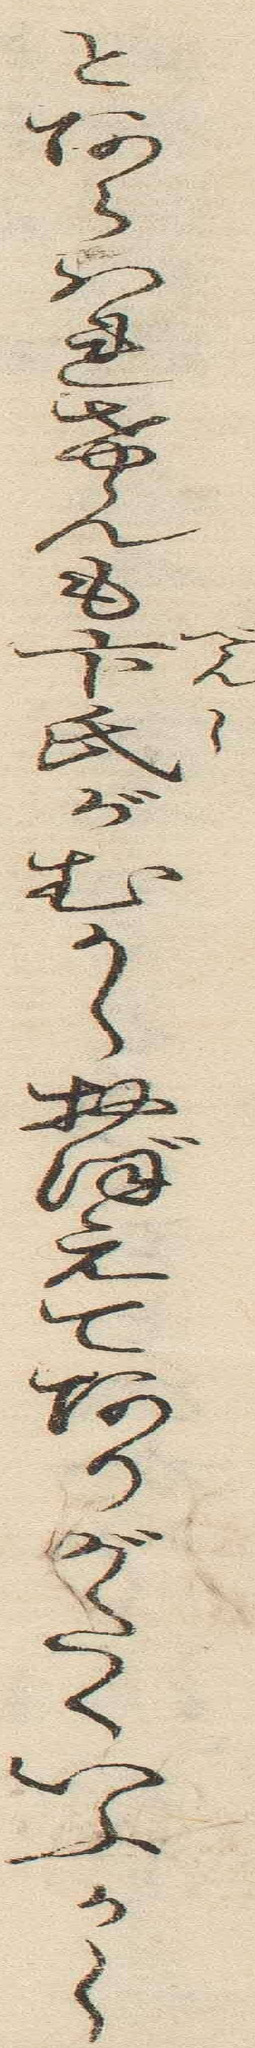とならはれけんも卞氏がむかしおぼえてありがたくいふかし
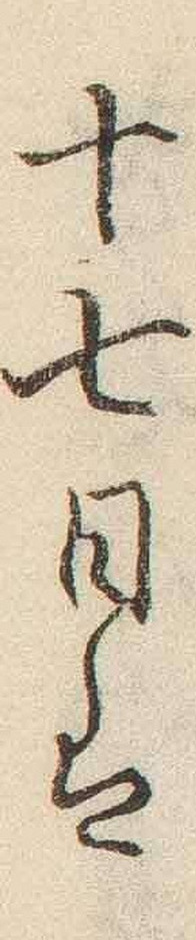十七日は
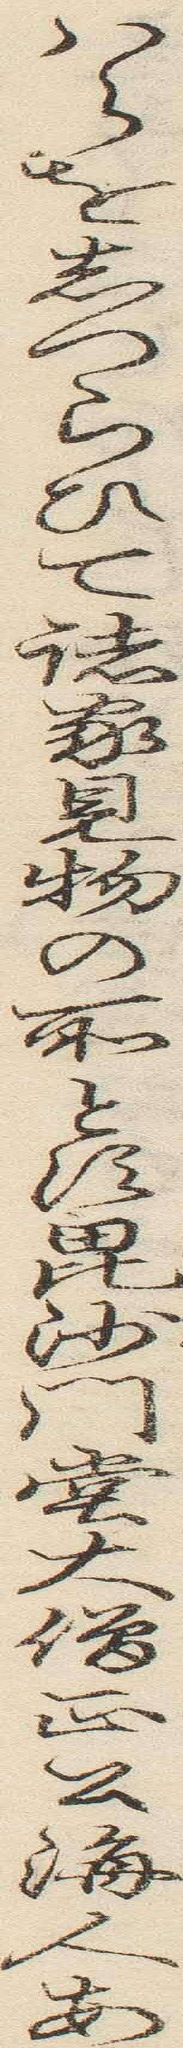はらをしつらひて諸家見物の所とす毘沙門堂大僧正公海人あ
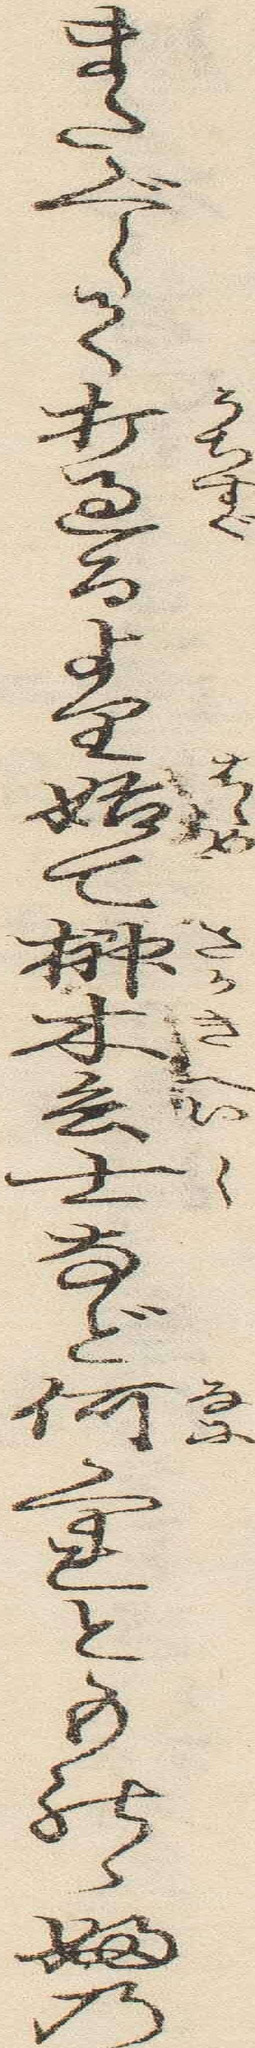またぐして打過るより始て榊木兵士など何くれとものゝふの
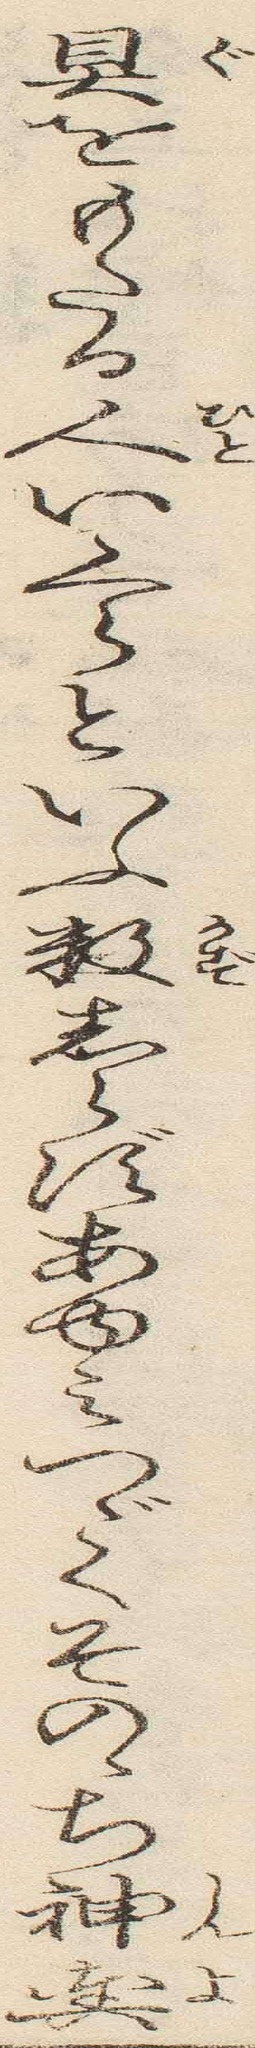具をもたる人いくらといふ数しらずあゆみつゞくそのゝち神輿
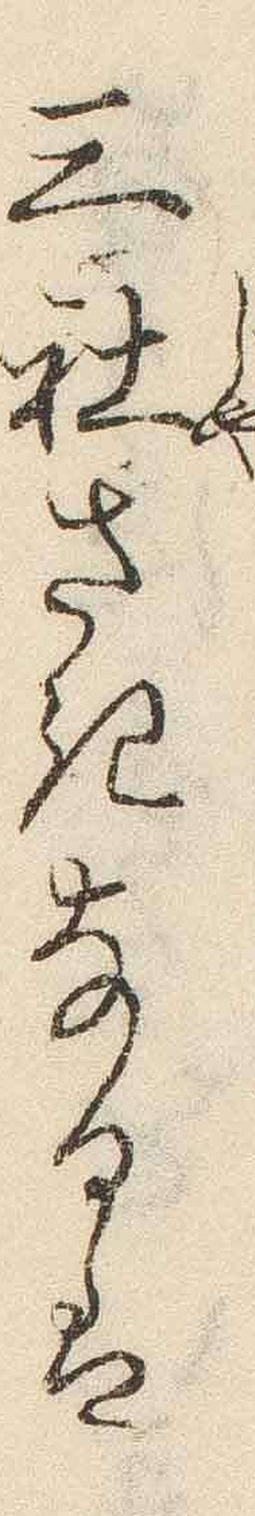三社さきなるは
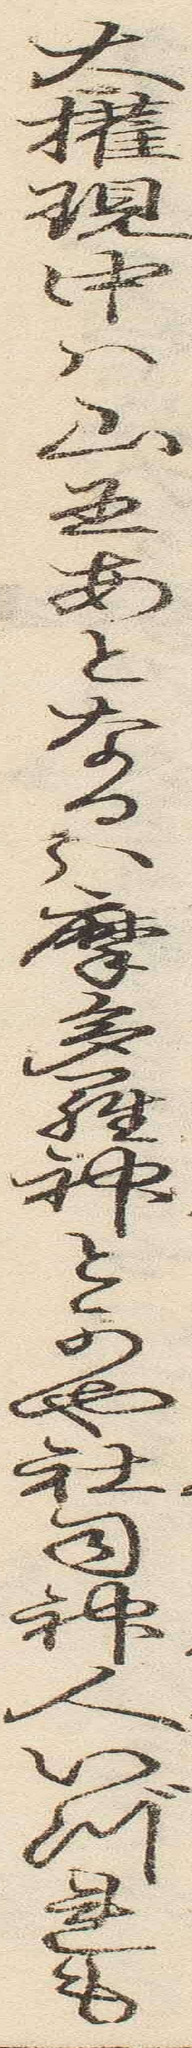大權現中は山王あとなるは摩多羅心とかや社司神人いづれも
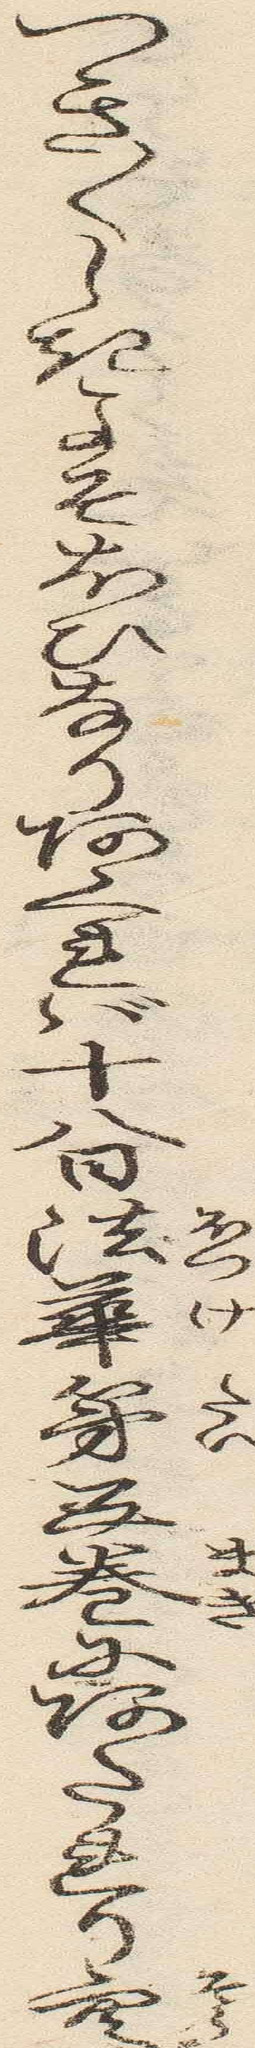つきくしきよそほひなりあくれば十八日法蕐第五巻にあたれり空
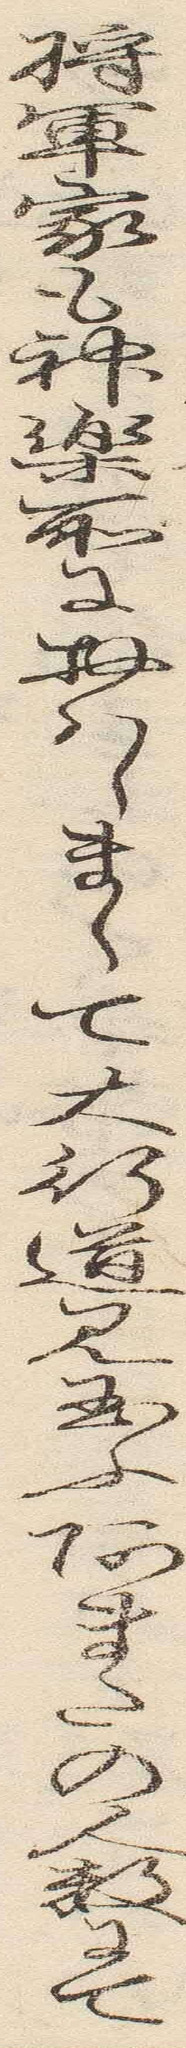将軍家も神樂所におはしまして大行道見玉ふあまたの人数にて
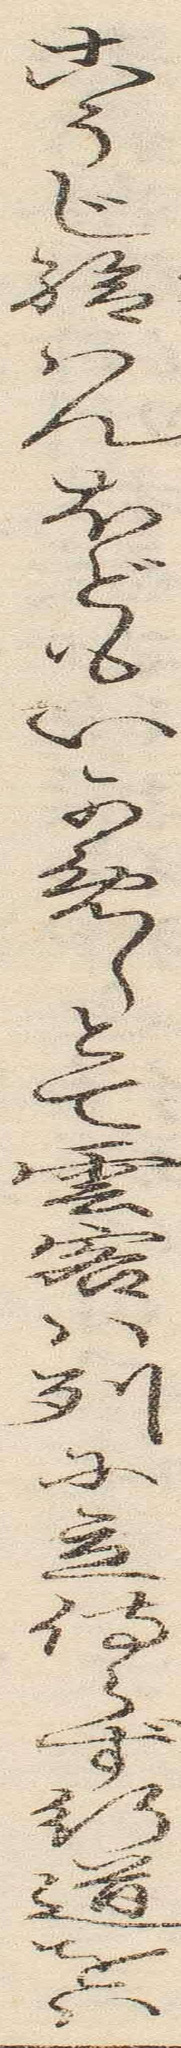こうじ給はんほどもいかめしとて雲客は列に立侍らず行道をは
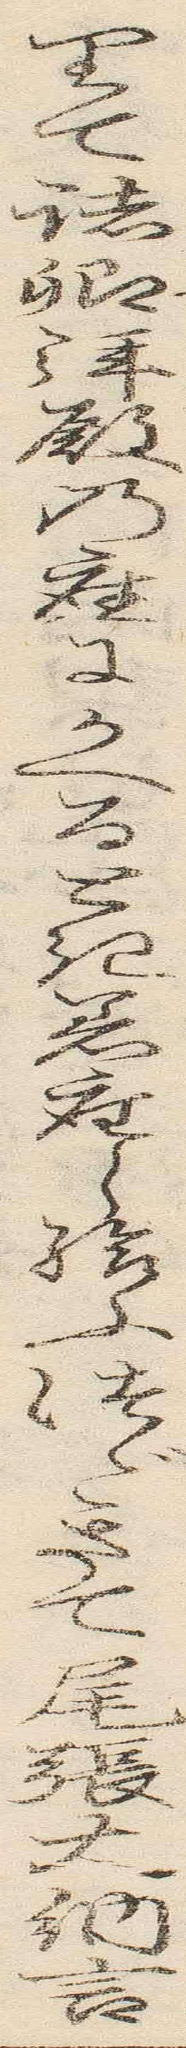りて諸卿拝殿の座にかへるとき着座し給ふつゞきて尾張大納言
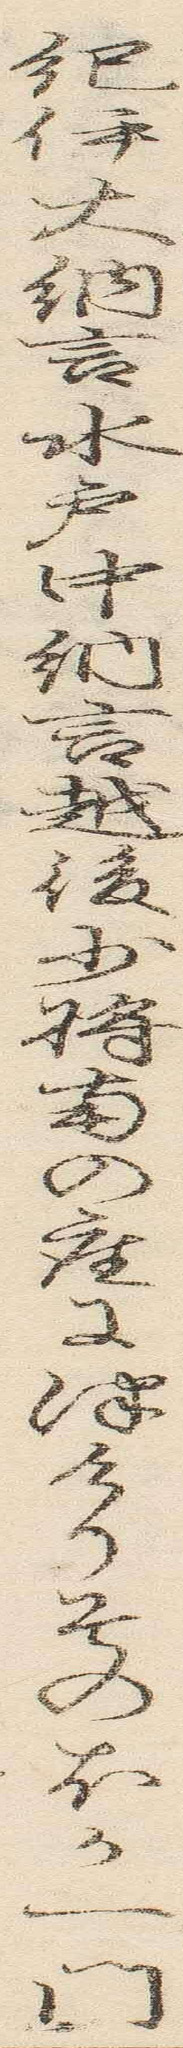紀伊大納言水戸中納言越後少将南の座につけりそのほか一門
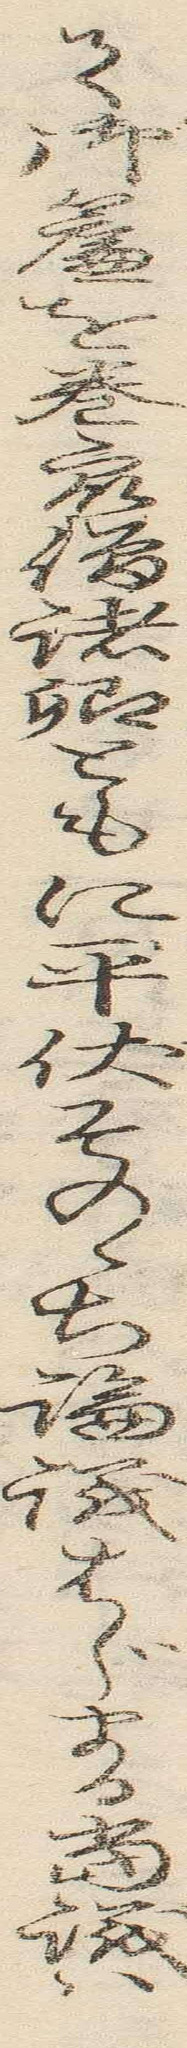て御簾を巻衆僧諸卿ともに平伏そのゝち論議はじまる當議は
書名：日光山志
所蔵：東京学芸大学附属図書館 国文学研究資料館
